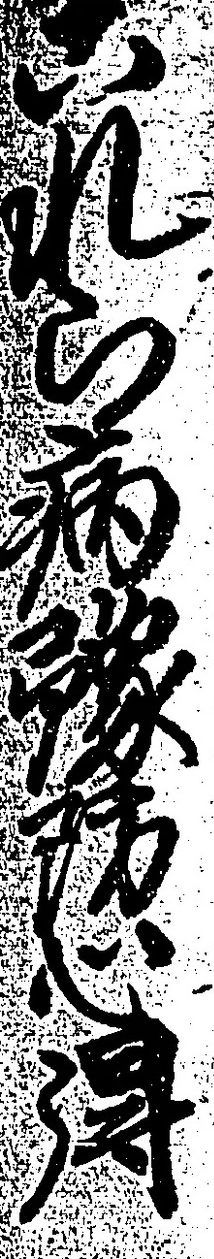これら病予防心得

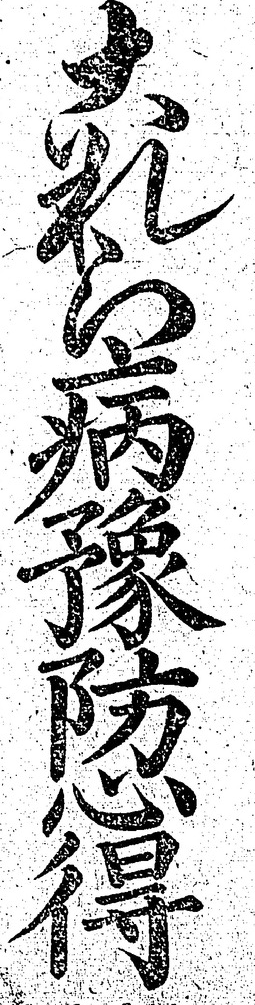これら病予防心得

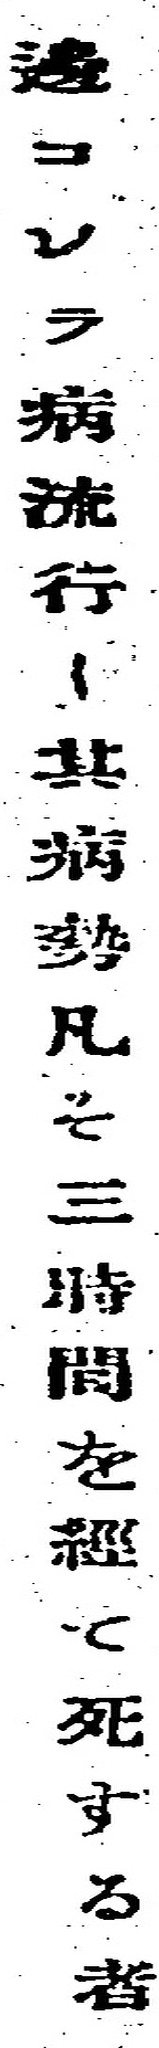辺コレラ病流行し其病勢凡そ三時間を経て死する者
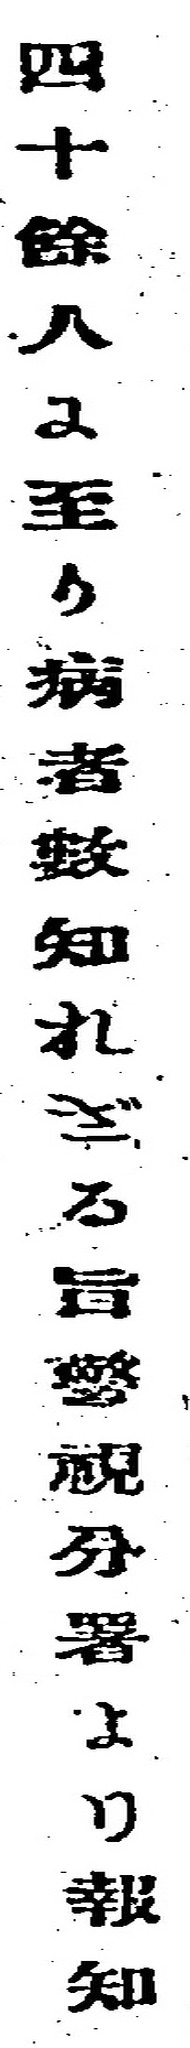四十余人に至り病者数知れざる旨警視分署より報知
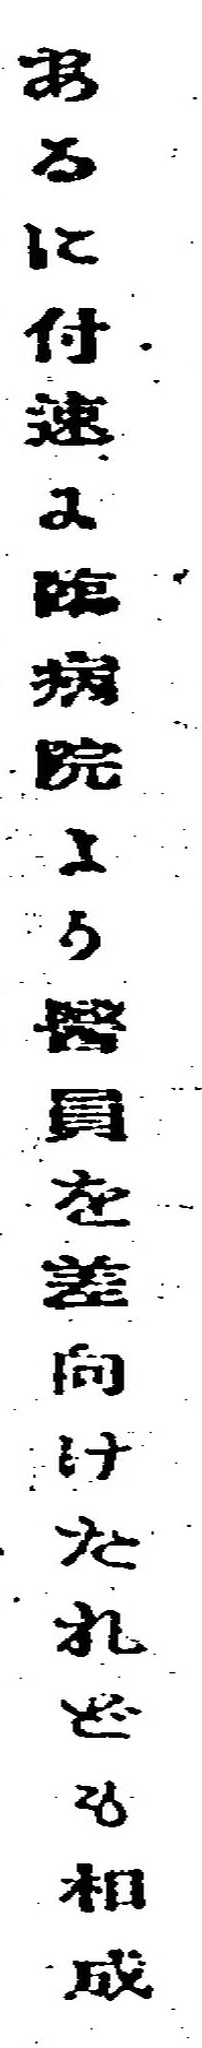あるに付速に臨病院より医員を差向けたれども相成
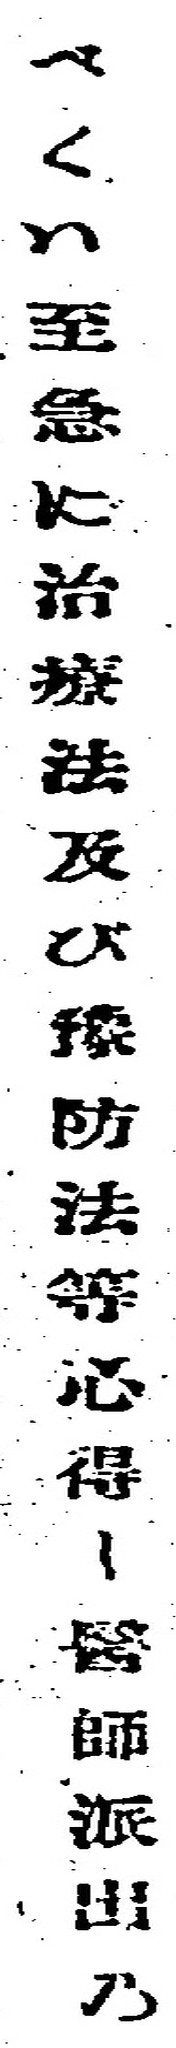ベくは至急に治療法及び予防法等心得し医師派出の
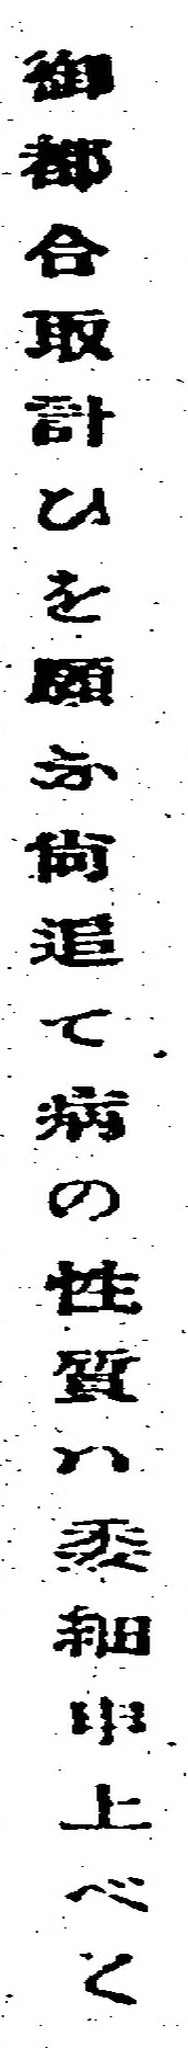御都合取計ひを願ふ尚追て病の性質は委細申上べく
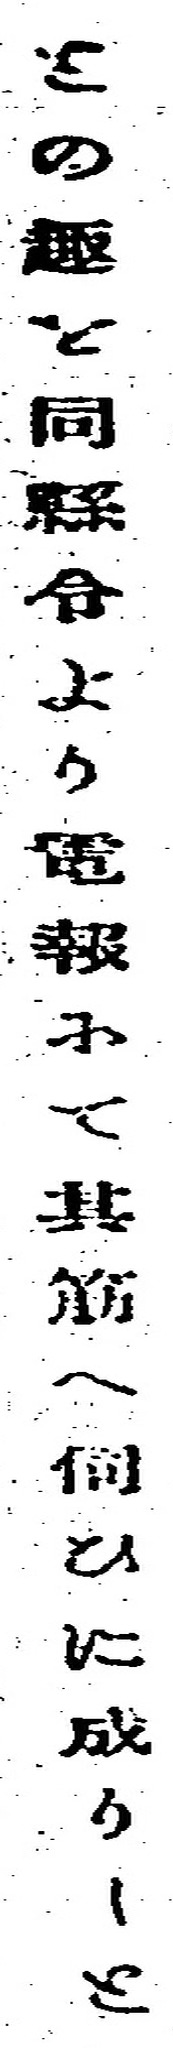との趣を同県令より電報にて其筋へ伺ひに成りしと

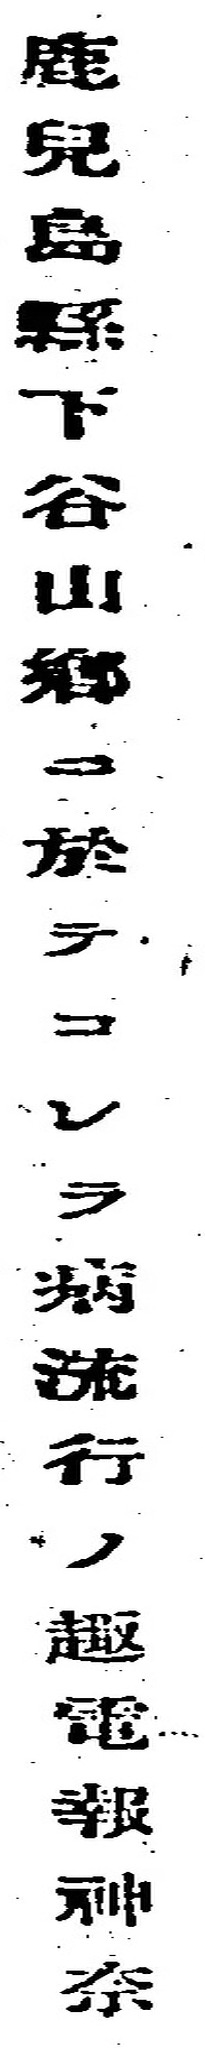鹿児島県下谷山郷ニ於テコレラ病流行ノ趣電報神奈
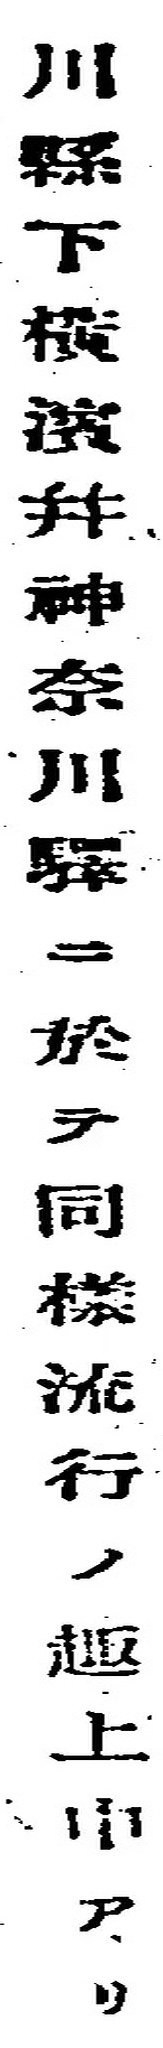川県下横浜并神奈川駅ニ於テ同様流行ノ趣上申アリ
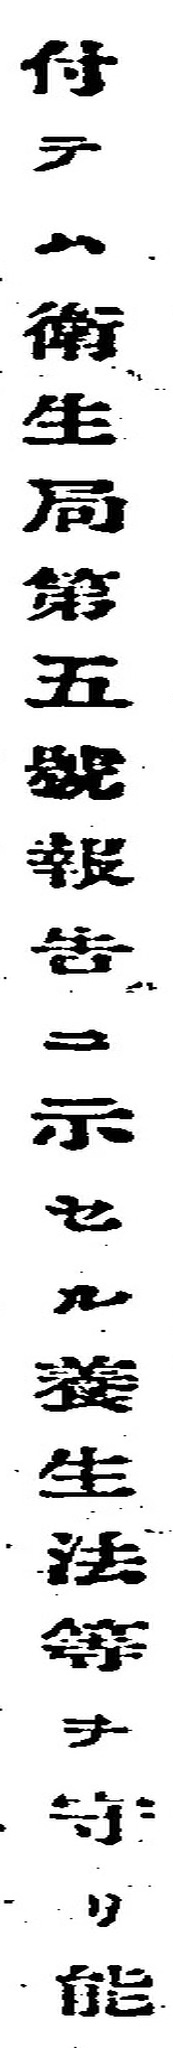付テハ衛生局第五号報告ニ示セル養生法等ヲ守リ能
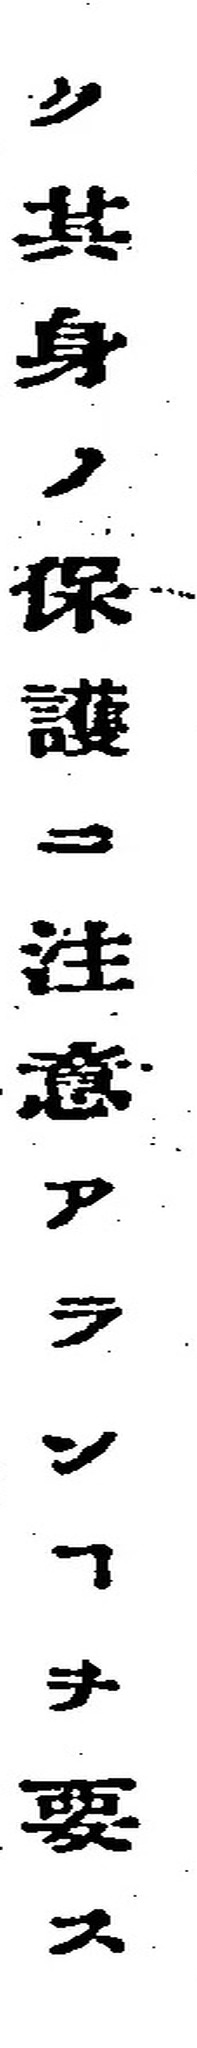ク其身ノ保護ニ注意アランコトヲ要ス
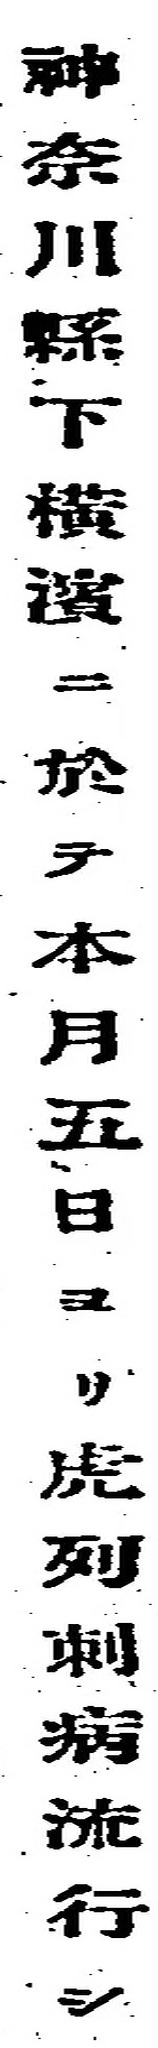神奈川県下横浜ニ於テ本月五日ヨリ虎列刺病流行シ
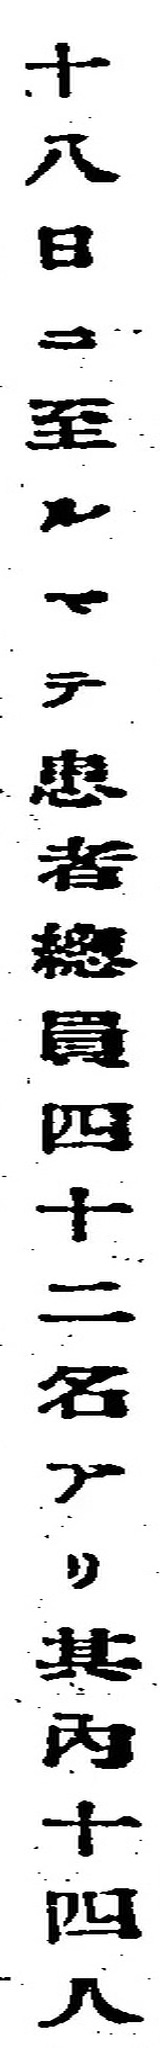十八日ニ至ルマテ患者総員四十二名アリ其内十四人
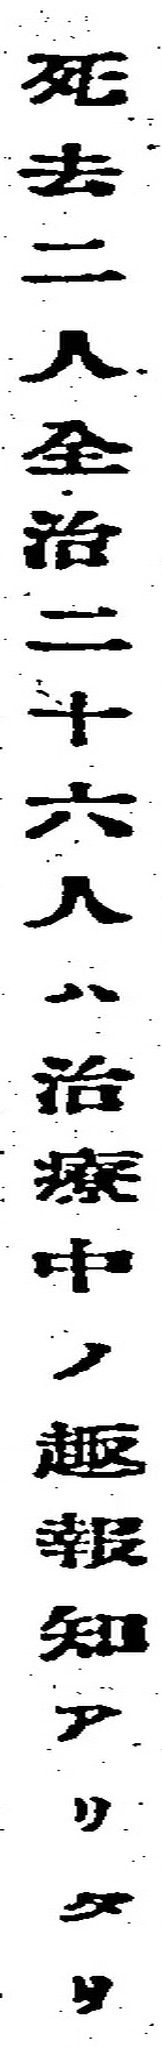死去二人全治二十六人ハ治療中ノ趣報知アリタリ
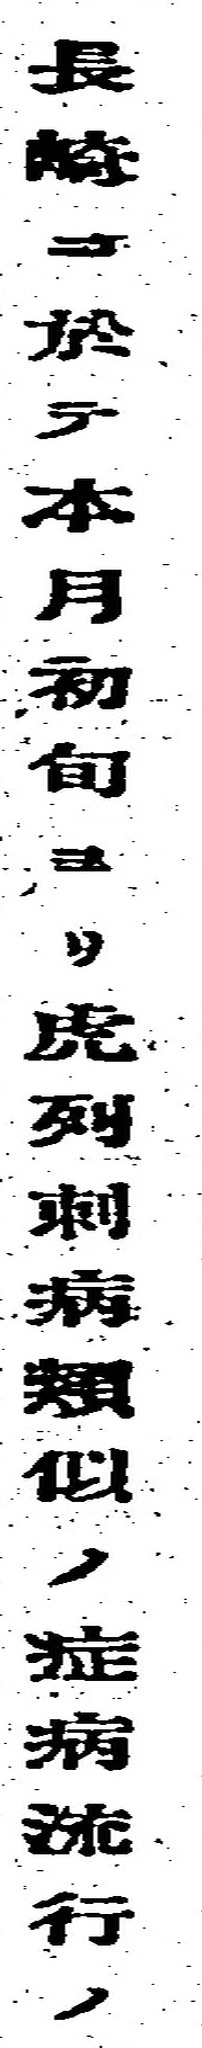長崎ニ於テ本月初旬ヨリ虎列刺病類似ノ症病流行ノ
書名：これら病予防心得
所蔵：国立国会図書館 National Diet Library, JAPAN
